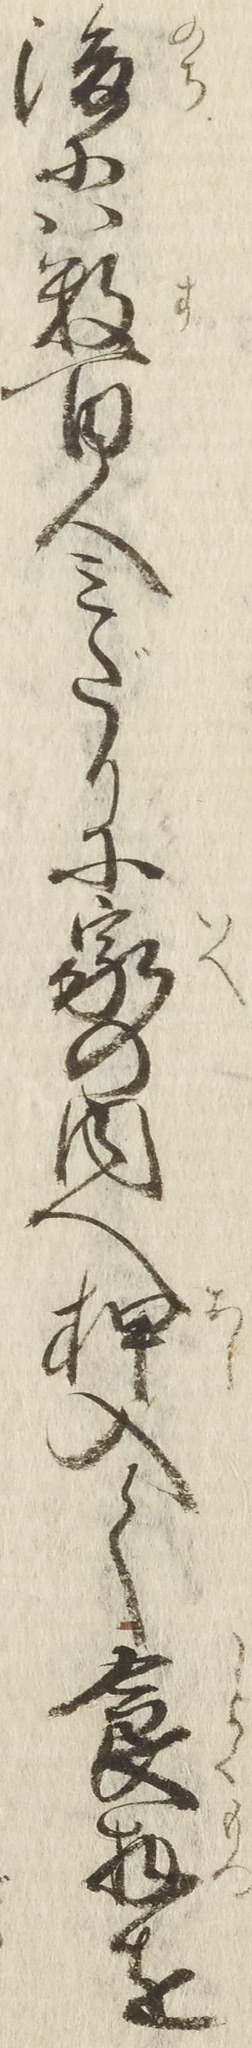後には数百人みたりに家の内へ押入て食物を
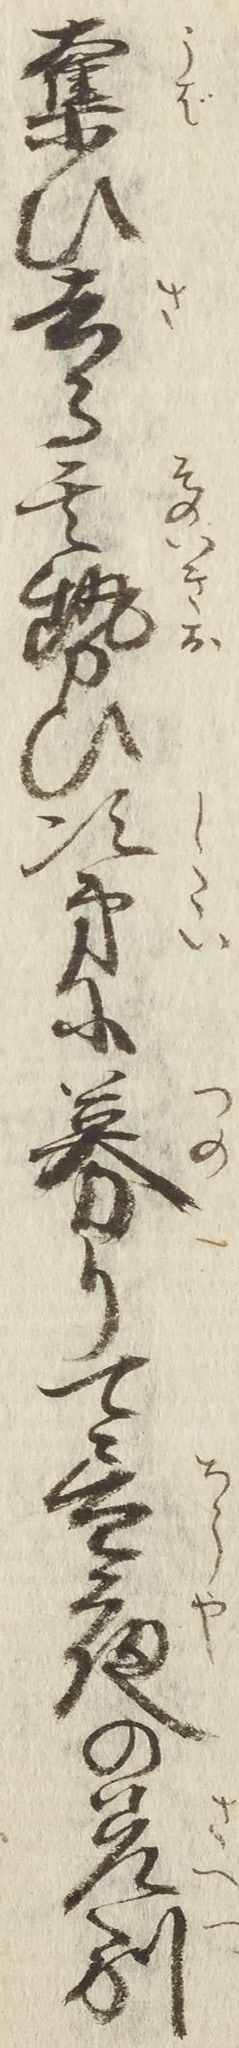奪ひ去る其勢ひ次第に募りて昼夜の差別
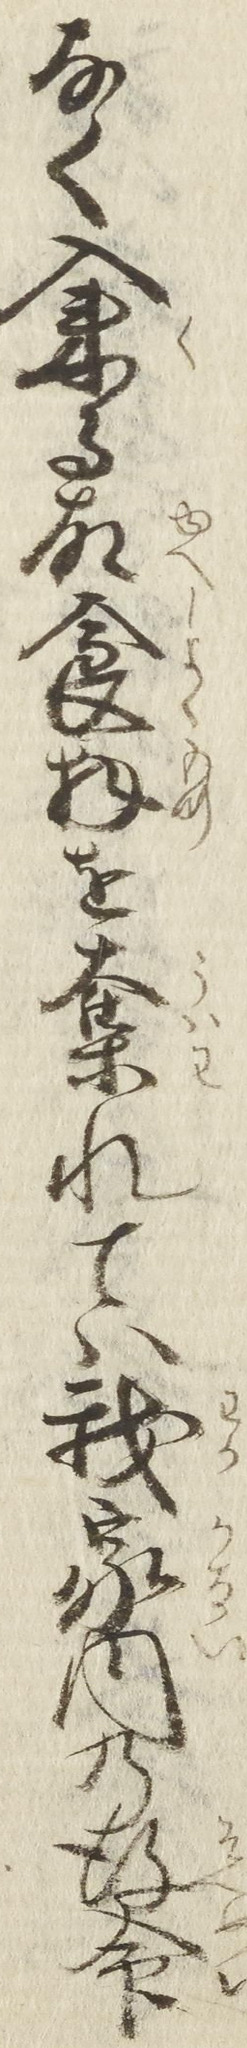なく入来る故食物を奪れては我家内の存命
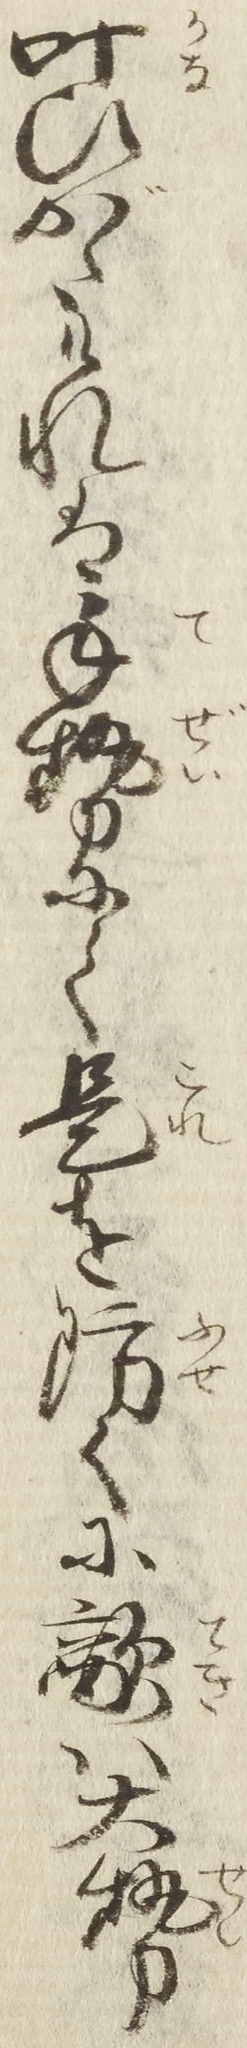叶ひかたけれは手勢にて是を防くに敵は大勢
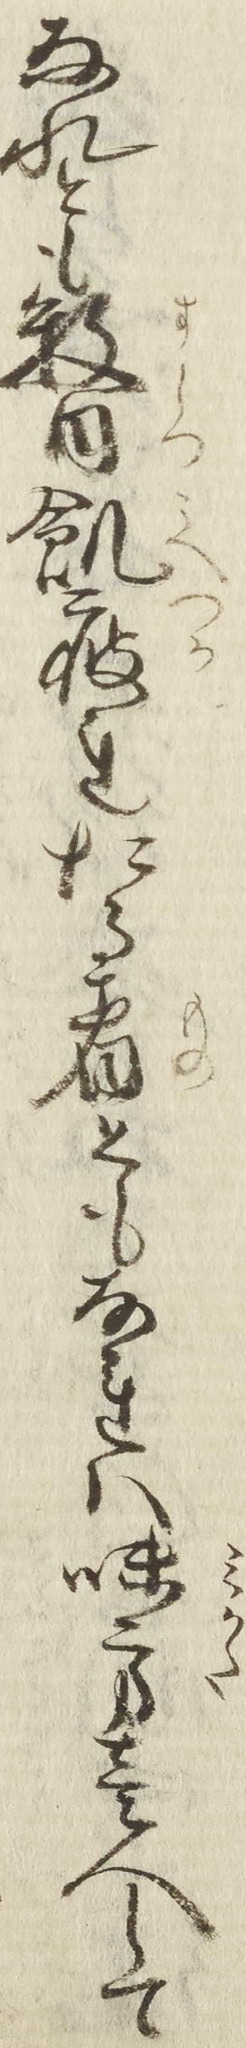なれとも数日飢疲れたる者ともなれは味方壱人して
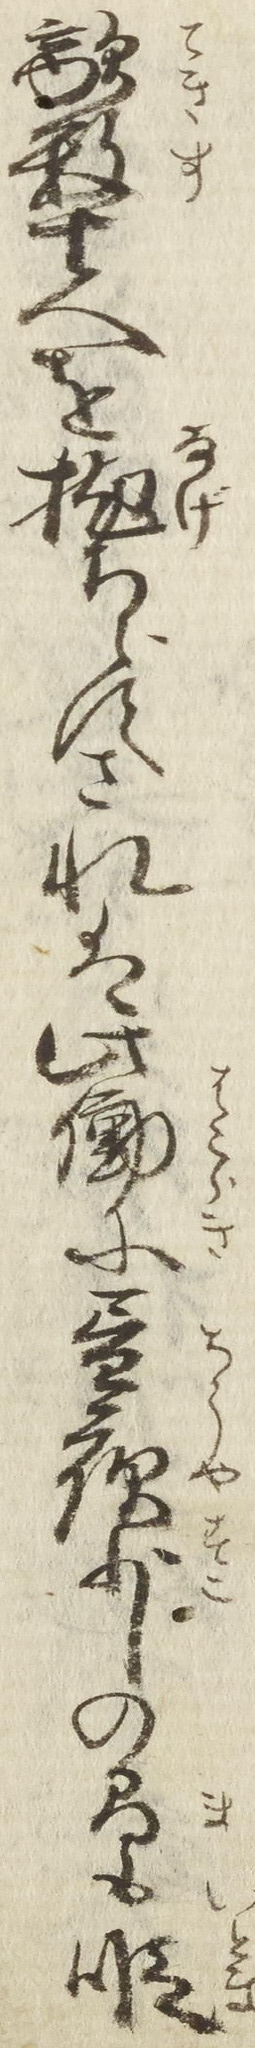敵数十人を抛ちらすされは此働に昼夜少しの間も暇
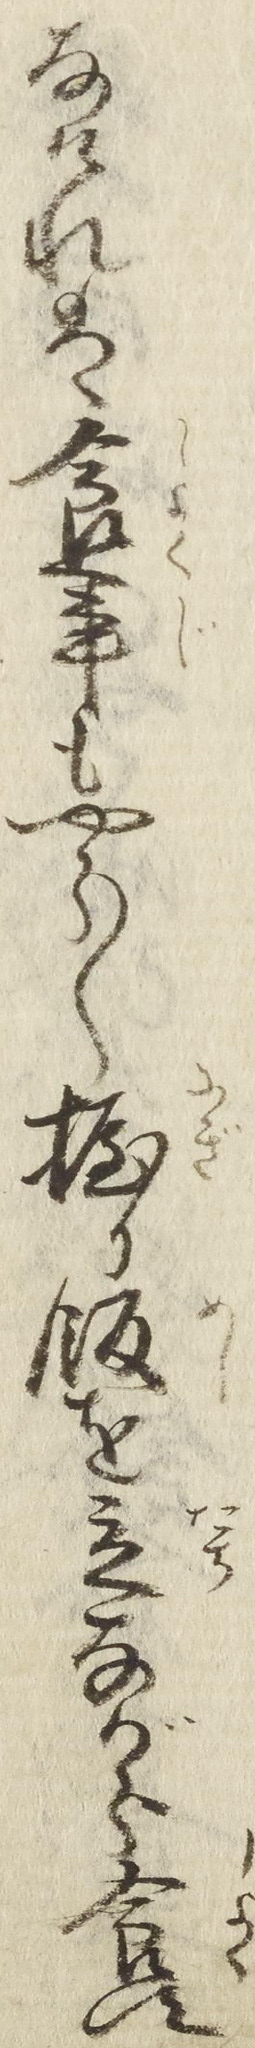なけれは食事もやう〳〵握り飯を立ながら食す

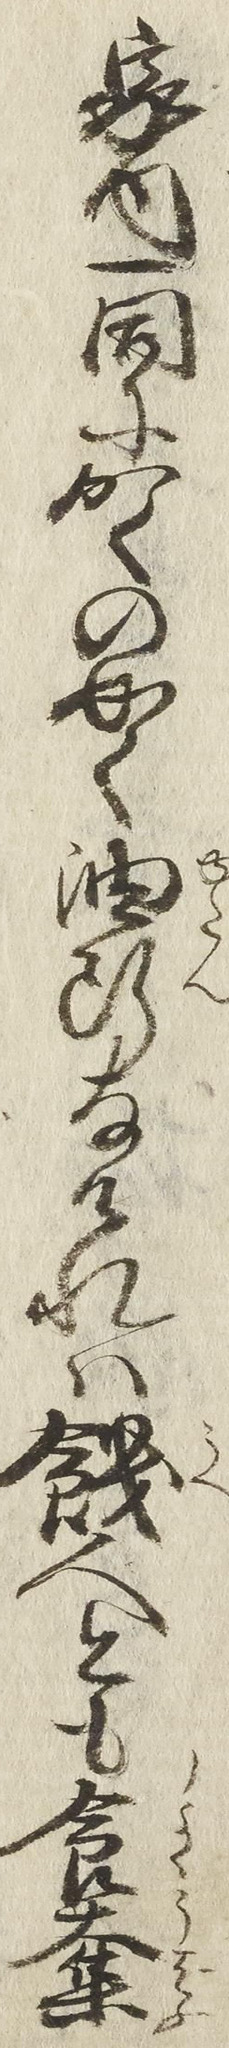家内一同にかくの如く油断なけれは餓人とも食奪
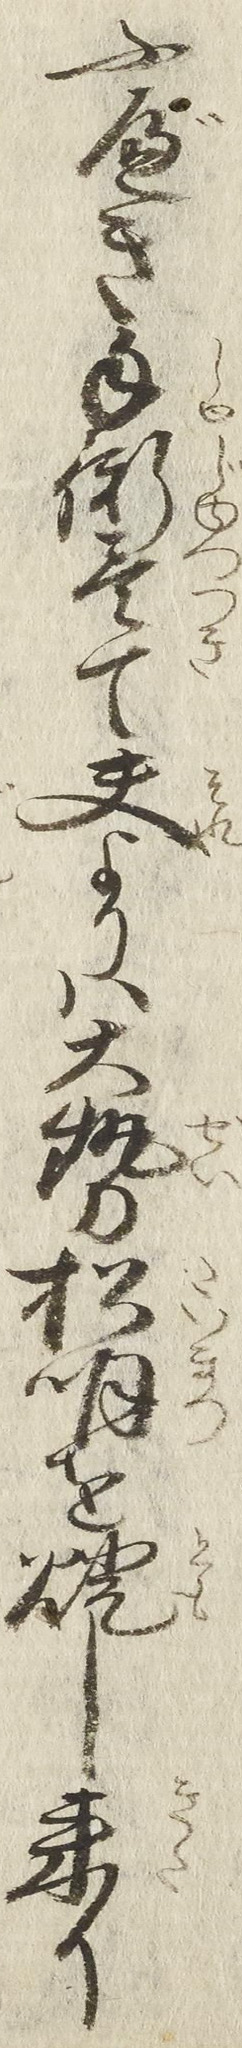ふべき手術尽て夫よりは大勢松明を燈し来り
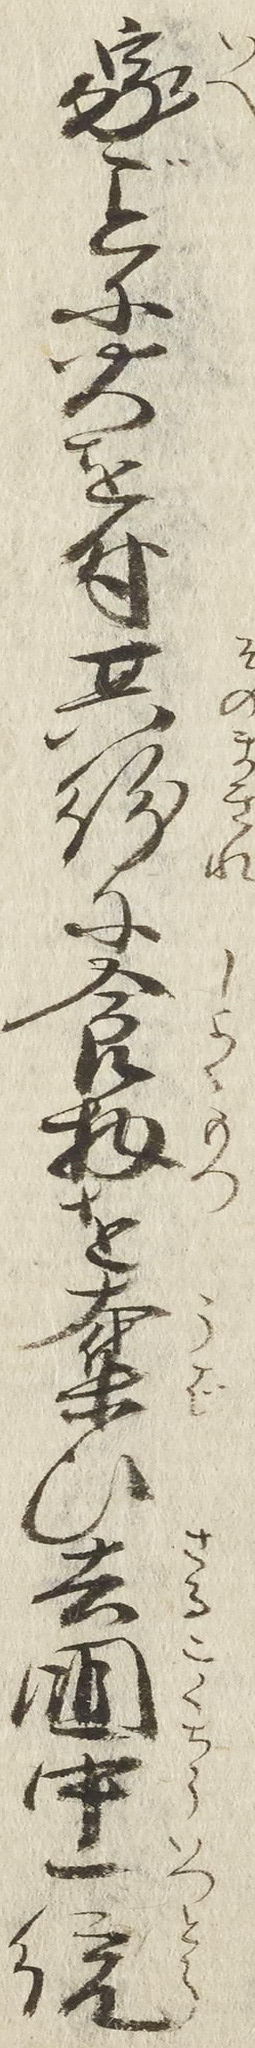家ごとに火を付其紛に食物を奪ひ去国中一統
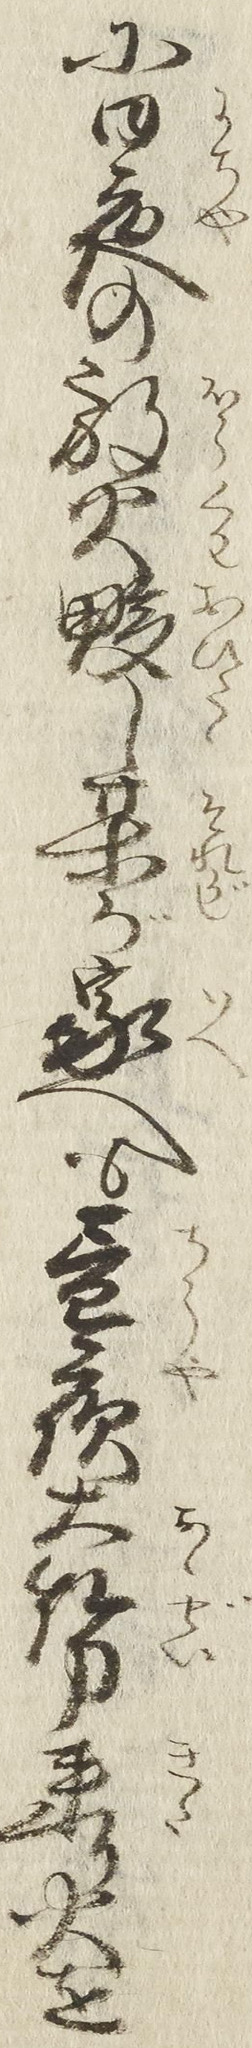に日夜の放火夥し某が家へも昼夜大勢来り火を
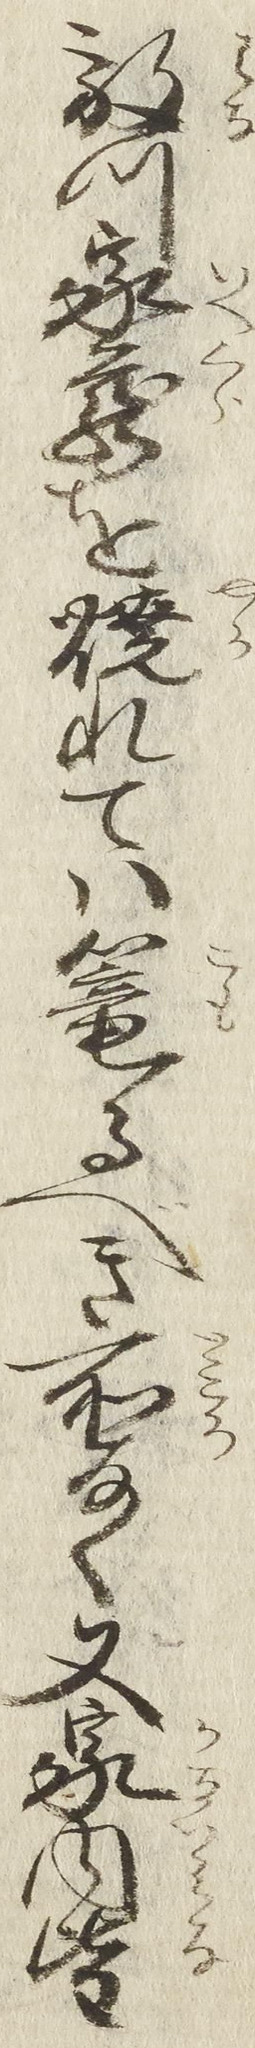放つ家蔵を焼れては篭るへき所なく又家内皆
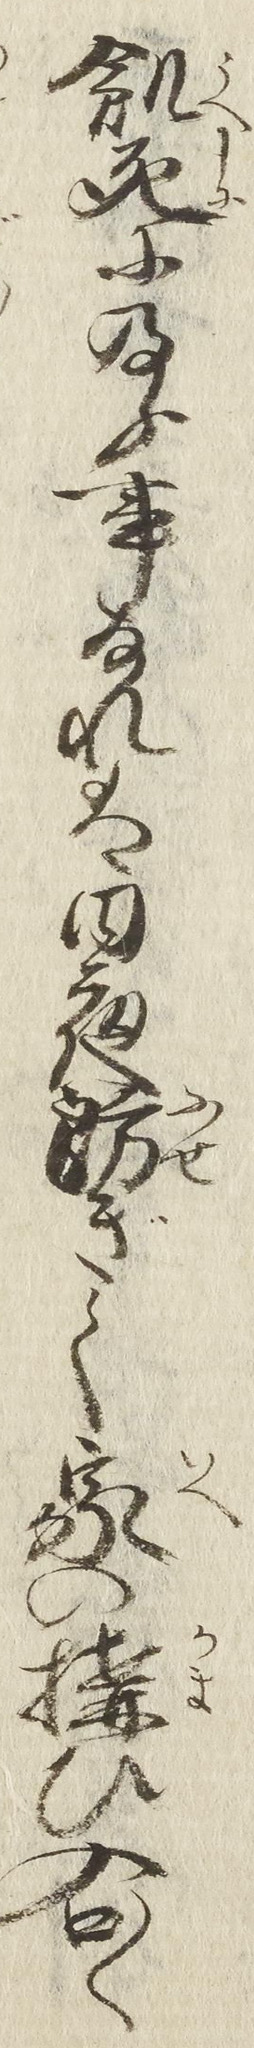飢死に及ふ事なれは日夜防ぎて家の構ひ入口〳〵
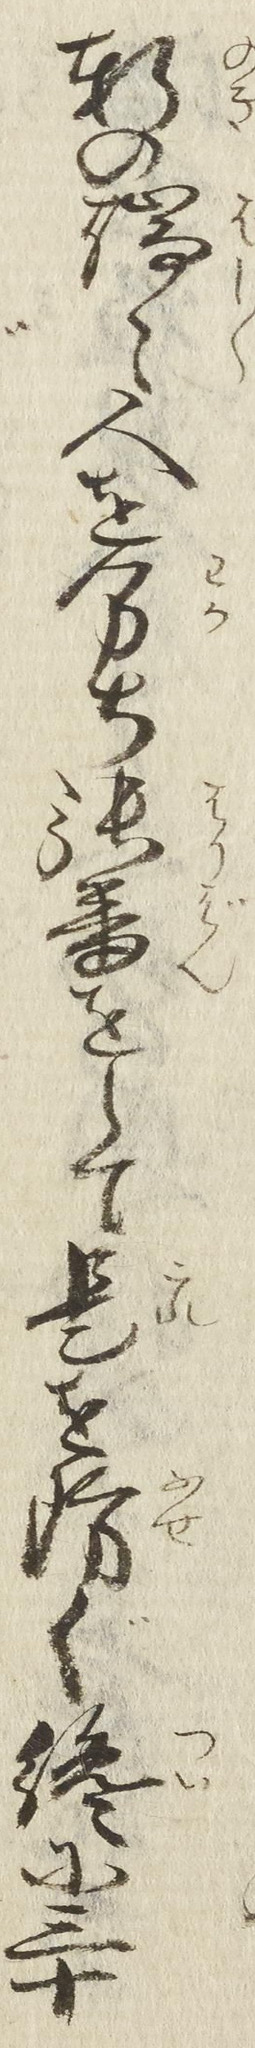軒の端〻人を分ち張番をして是を防く終に三十
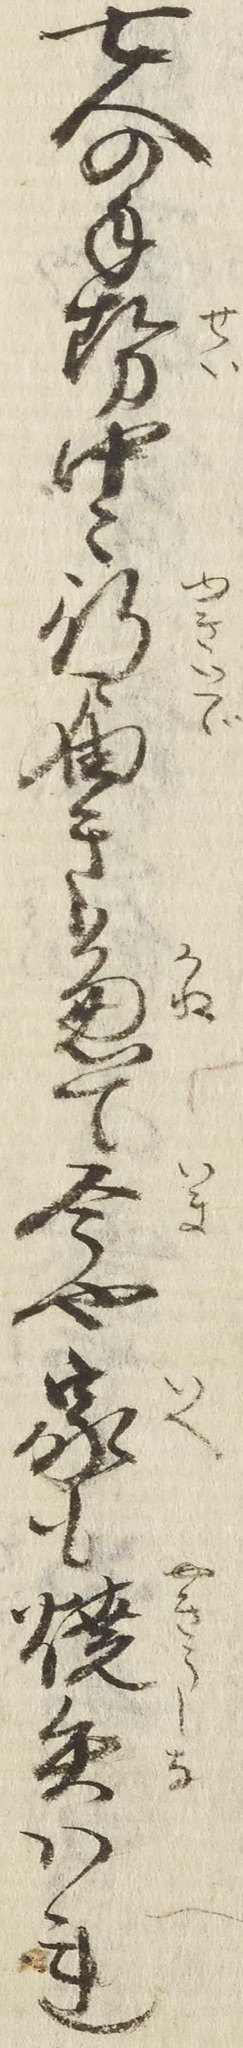七人の手勢中〻行届き兼て今や家も焼失はれ
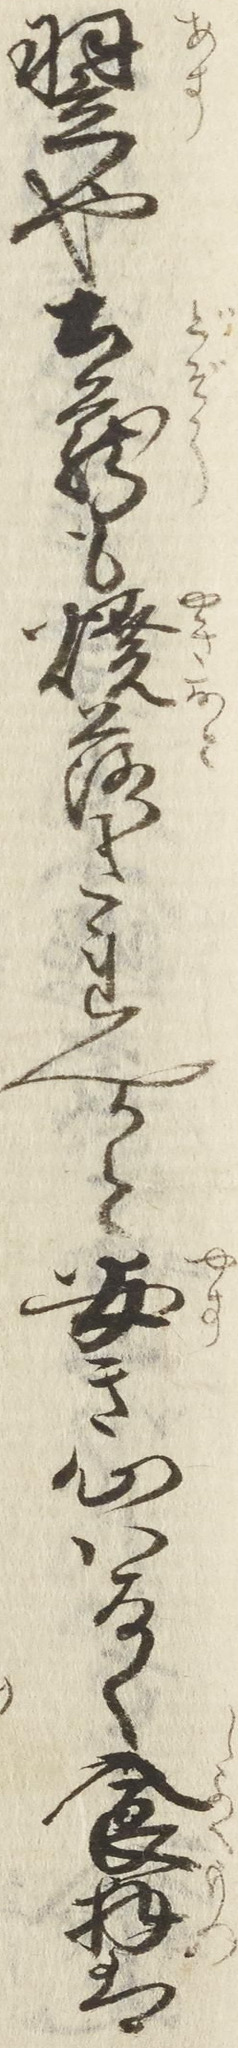翌や土蔵も焼落されんかと安き心はなく食物は
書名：天明奇畧　全
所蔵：東京大学地震研究所図書室 Earthquake Research Institute Library, The University of Tokyo, JAPAN
